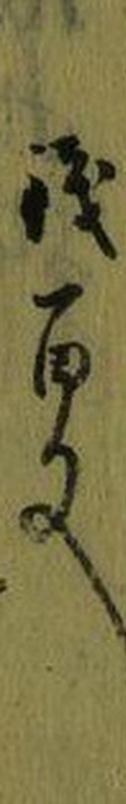銭百文
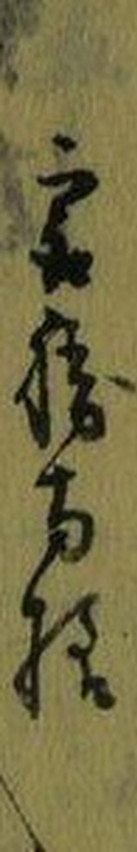最勝寺様
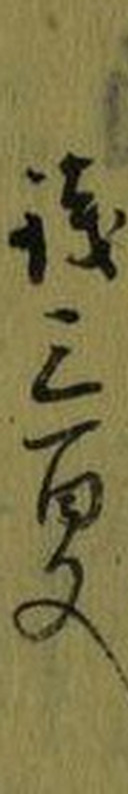銭三百文
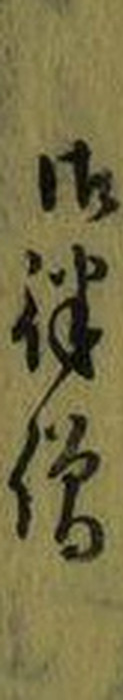御伴僧
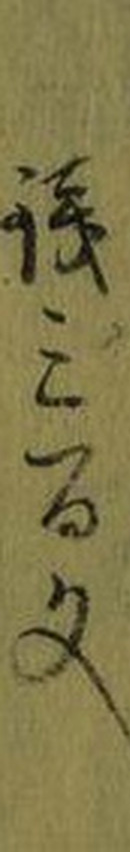銭三百文
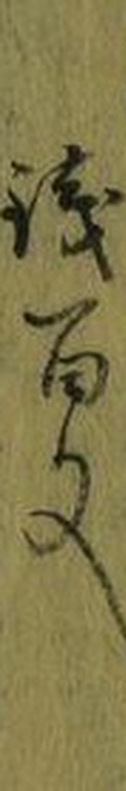銭百文
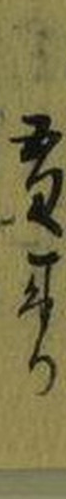五匁来り
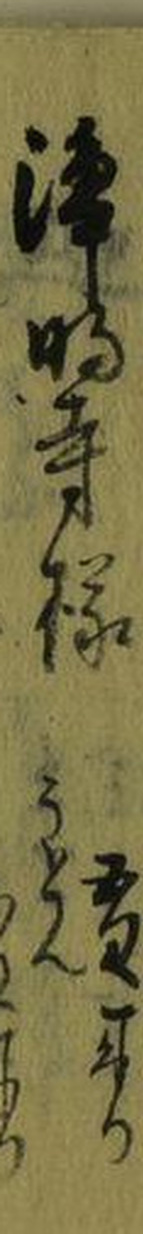浄明寺様五匁来り
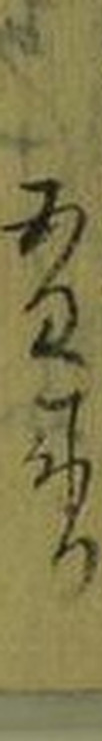五匁来り
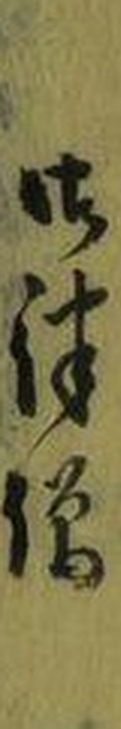御伴僧
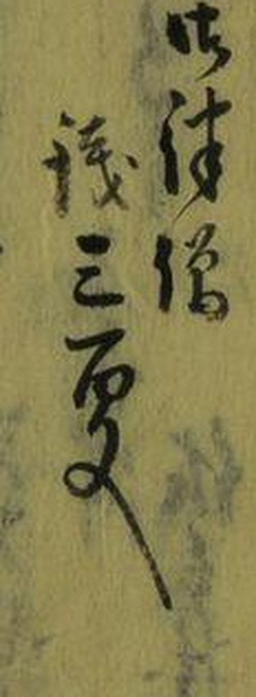銭三百文

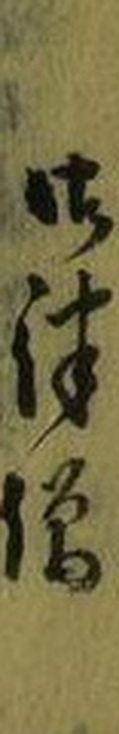御伴僧
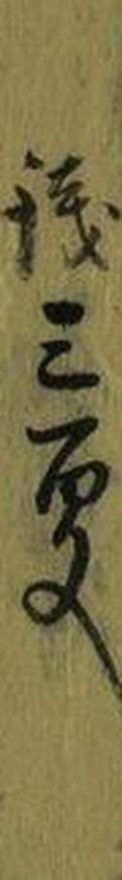銭三百文
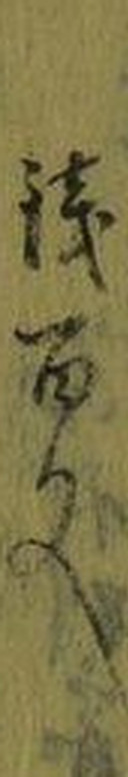銭百文
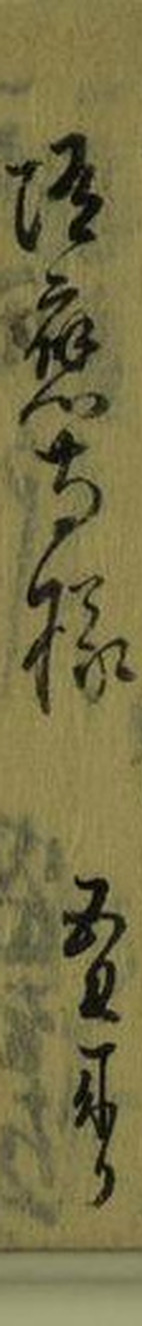随応寺様五匁来り
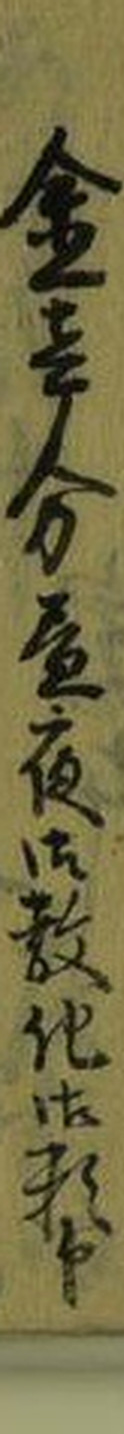金壱分昼夜御教化御頼申
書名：（献立覚）
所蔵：福井県文書館 Fukui Prefectural Archives
